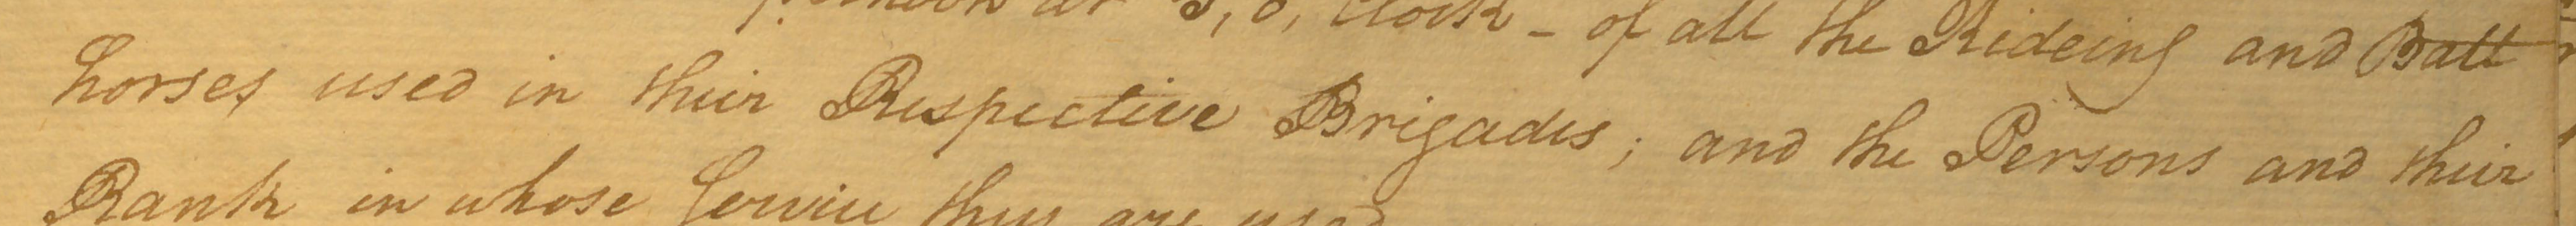horses used in their Respective Brigades; and the Persons and their
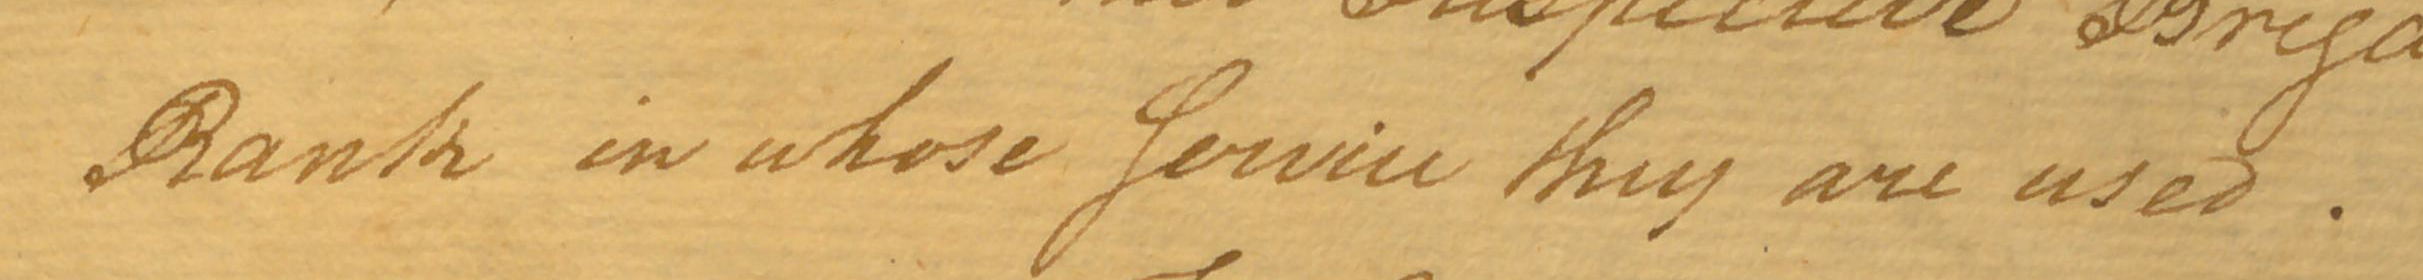Rank in whose Service they are used.
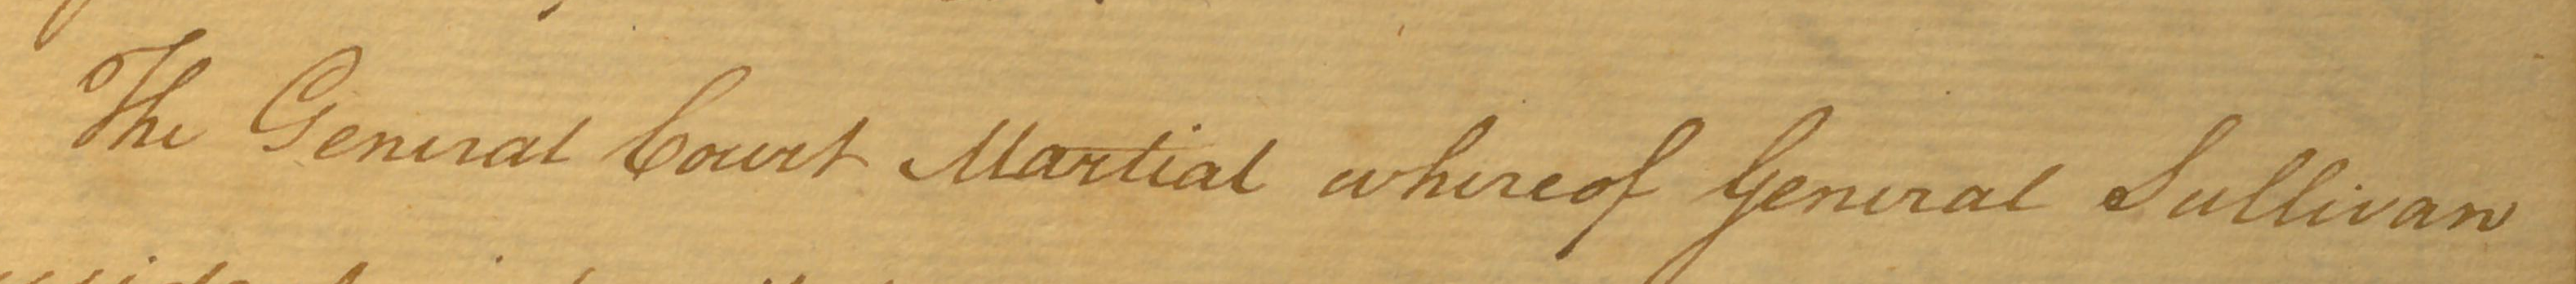The General Court Martial whereof General Sullivan
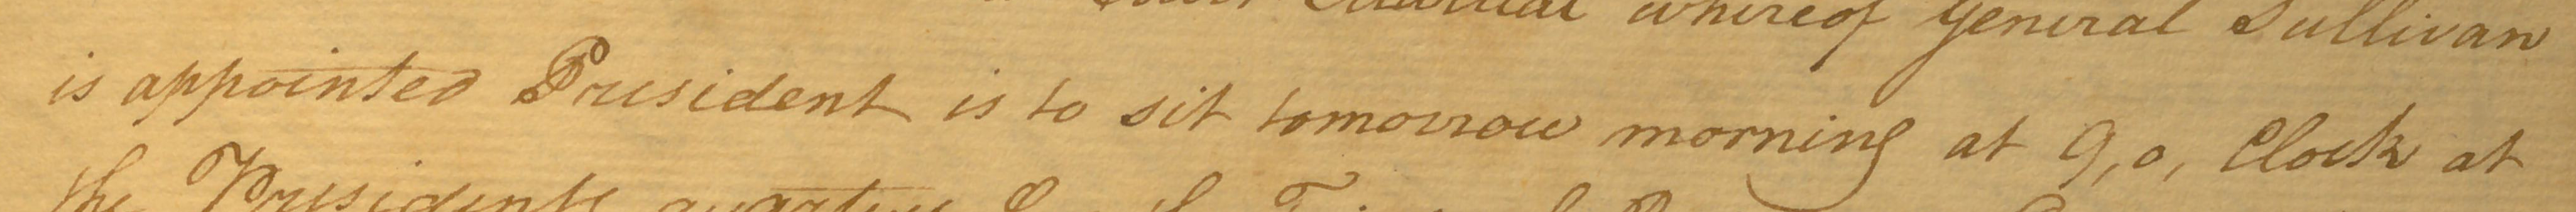is appointed President is to sit tomorrow morning at 9, o,Clock at
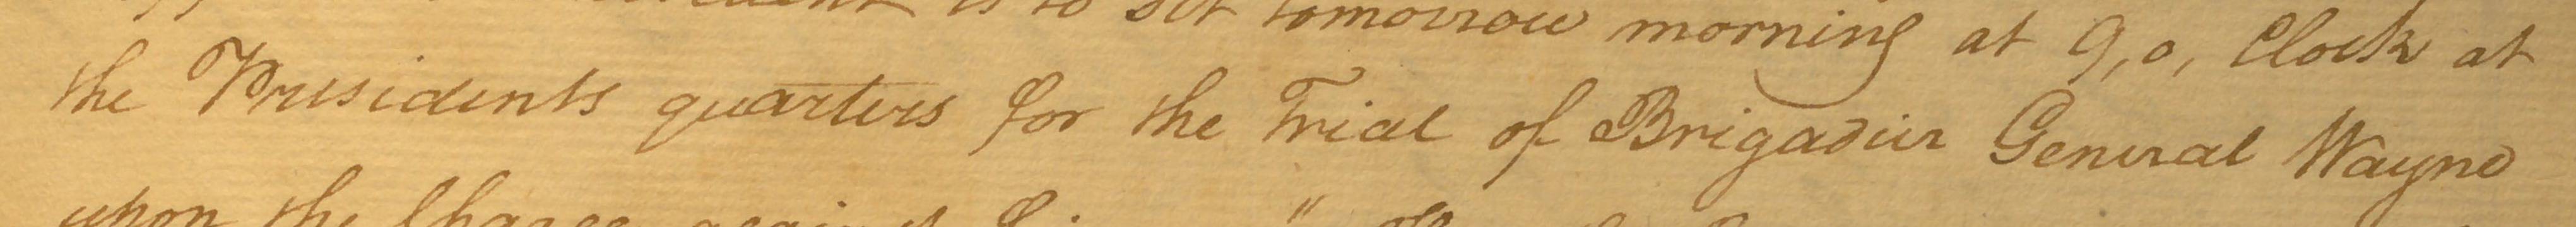the Presidents quarters for the Trial of Brigadier General Wayne
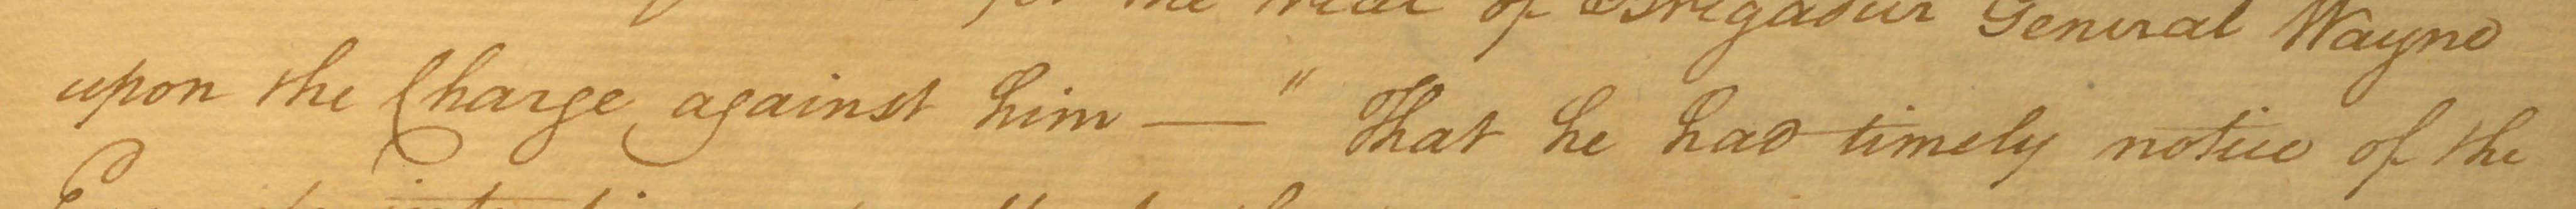upon the Charge against him- That he had timely notice of the
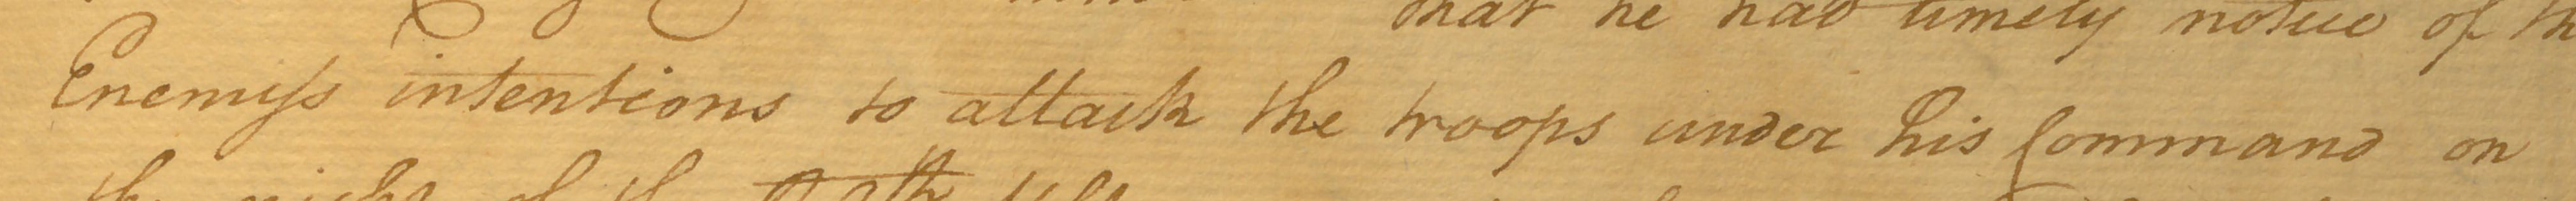Enemy's intentions to attack the troops under his Command on
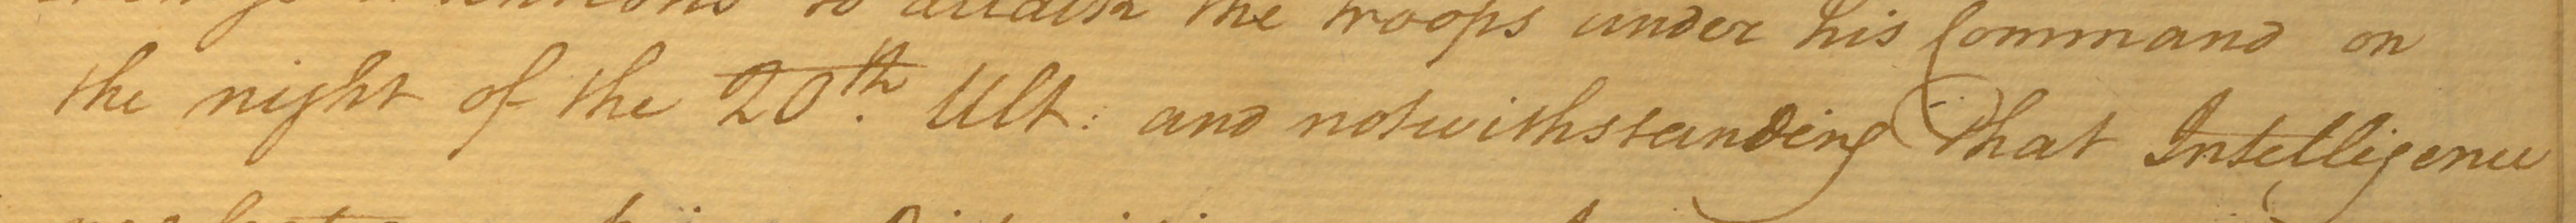the night of the 20^th. Ult: and notwithstanding that Intelligence
